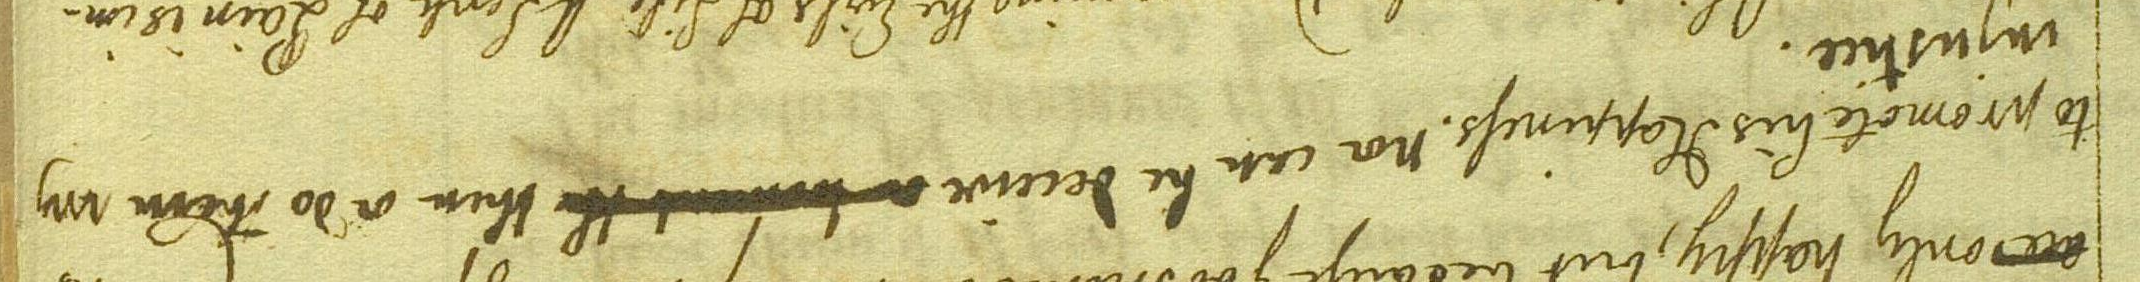to promote his Happiness. nor can he deceive [__ ____ __] then or do them any
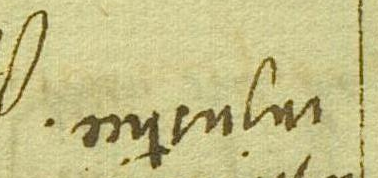injustice.
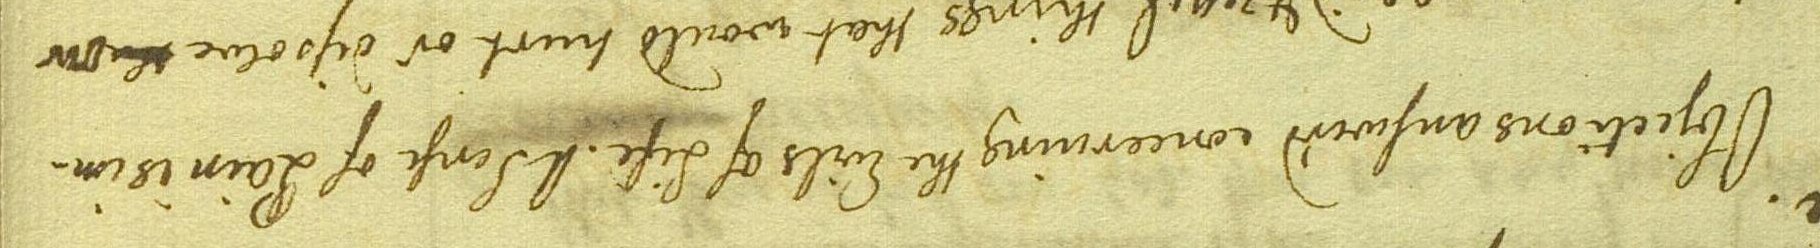Objections answer'd concerning the Evils of Life. A Sense of Pain is im-
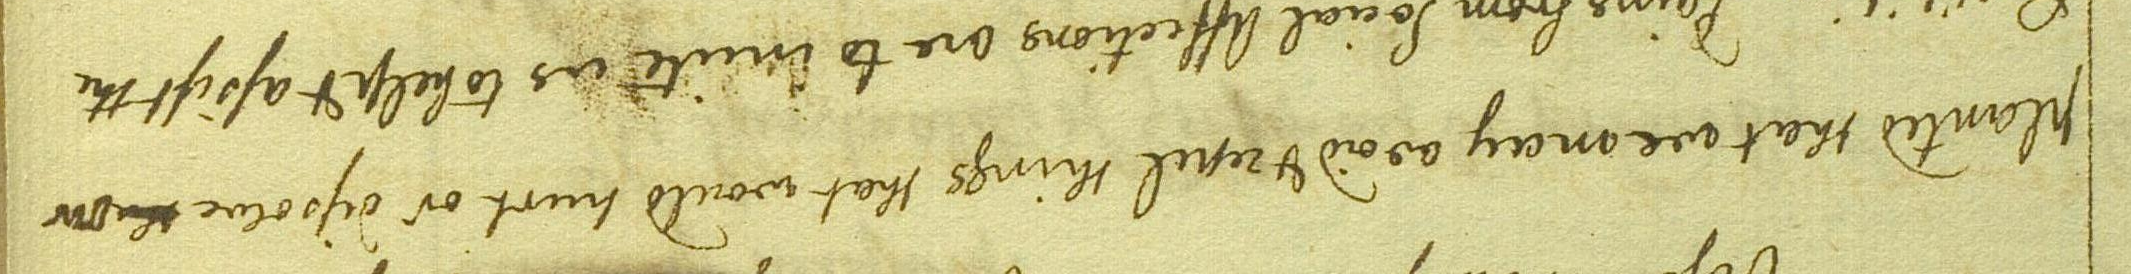planted that we may avoid & repel things that would hurt or dissolve [_____]
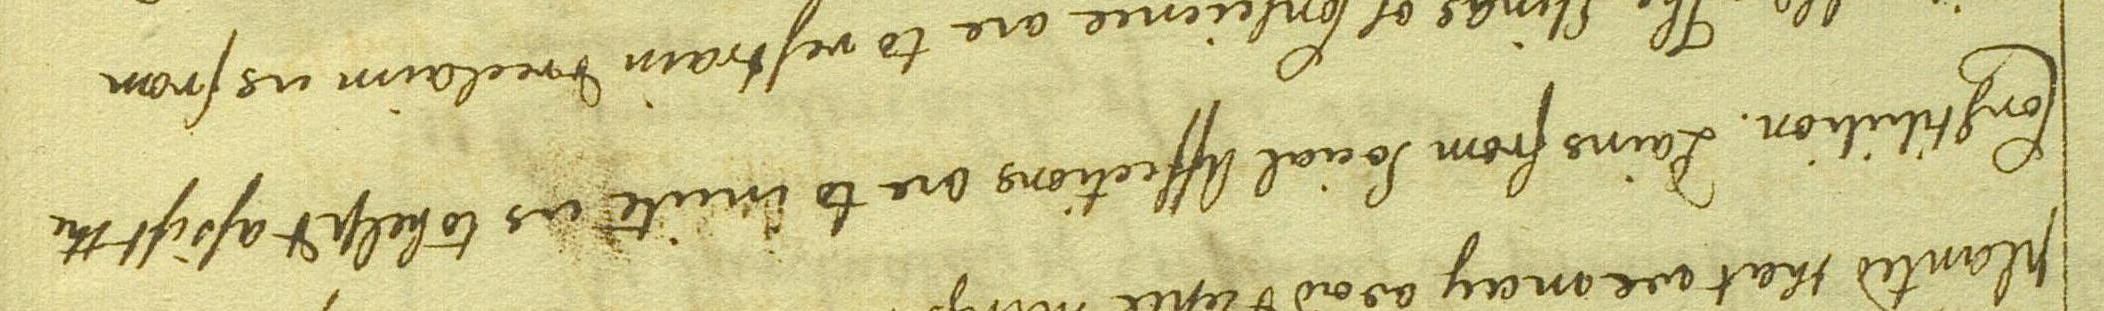Constitution. Pains from Social Affections are to incite us to help & assist the
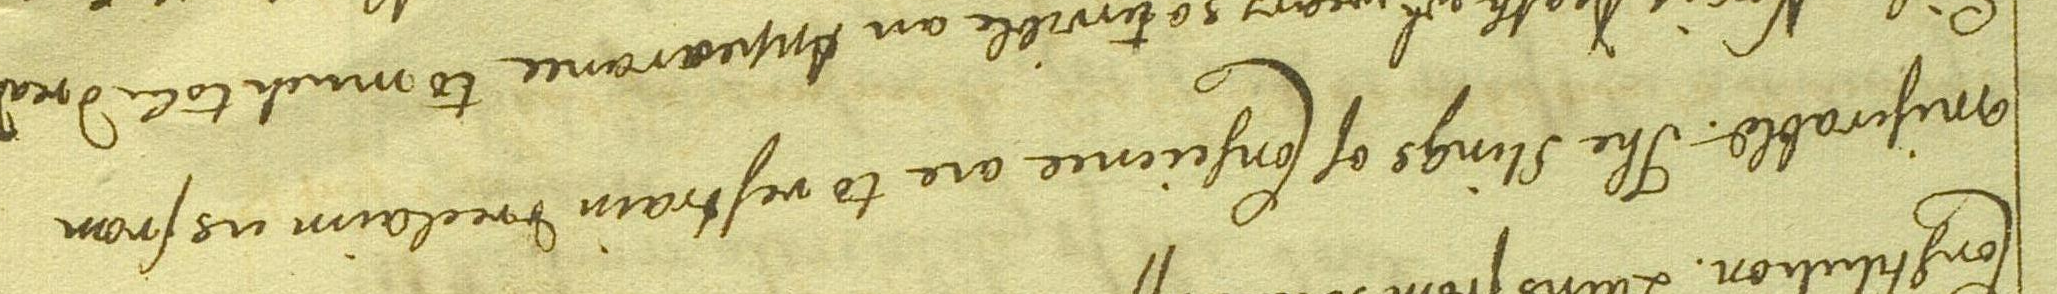miserable. The Stings of Conscience are to restrain & reclaim us from
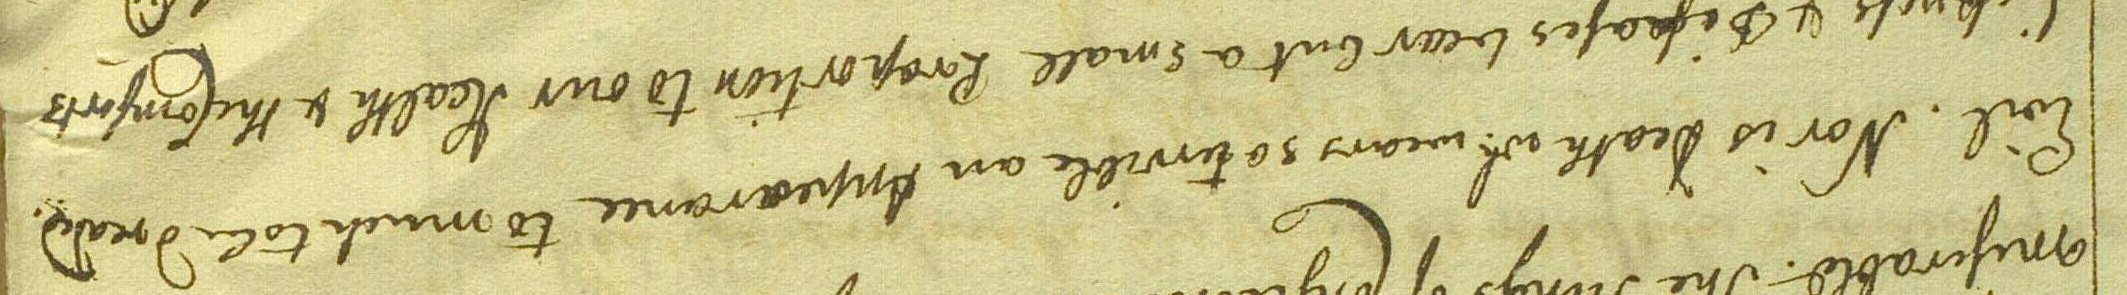Evil. Nor is Death w^h. wears so terrible an Appearance to much to be dreaded.
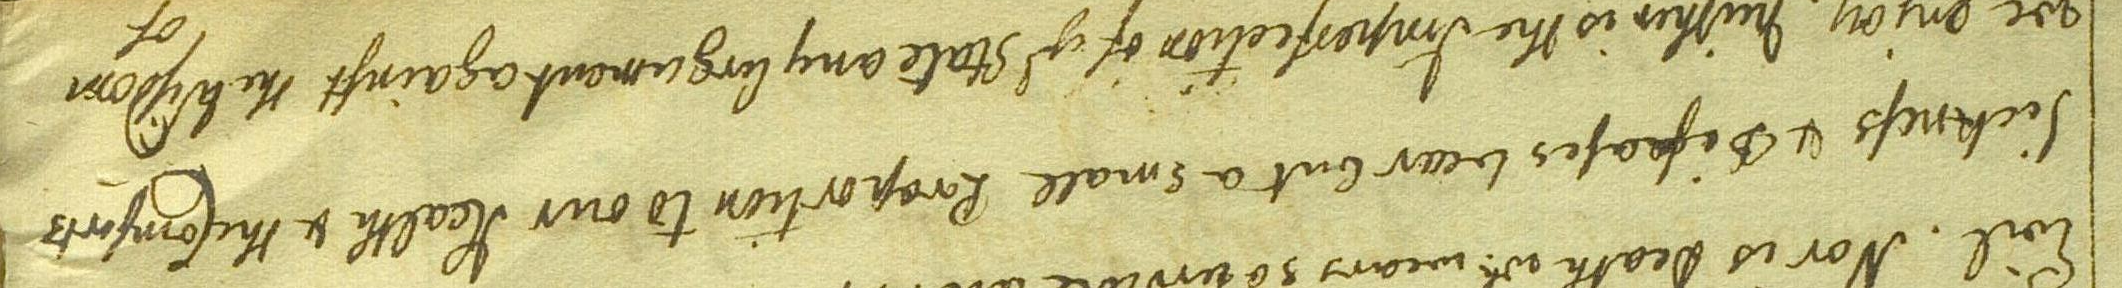Sickness & Diseases bear but a small Proportion to our Health & the Comforts
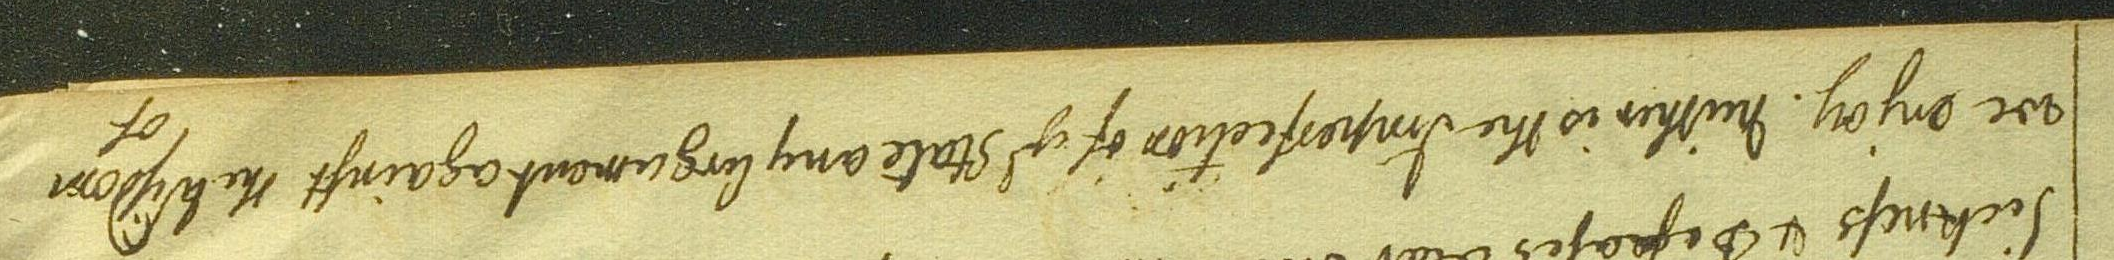we enjoy. Neither is the Imperfection of y^e State any Argument against the Wisdom
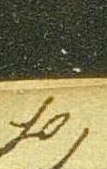of
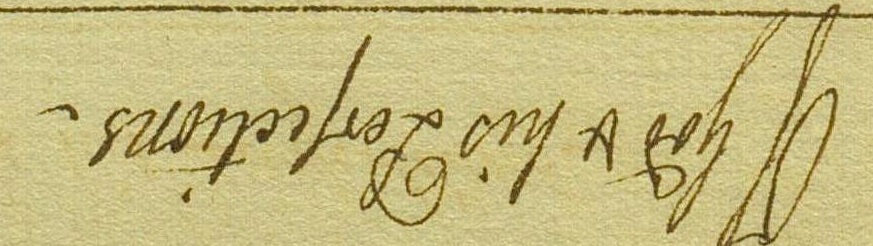Of God & his Perfections.
